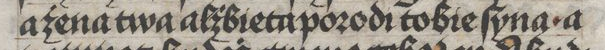a żena twa alżbieta porodi tobie ſyna.a
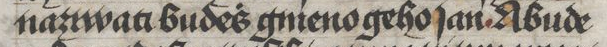nazwati budeṡ gmeno geho Ian.A bude
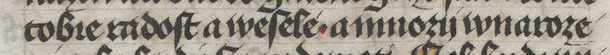tobie radoſt a weſele.a mnozij wnaroze¬
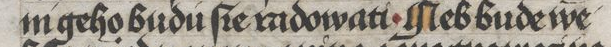ní geho budu ſie radowati.Neb bude we¬
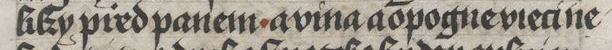liky pṙed panem.a vina a opogne vieci ne¬
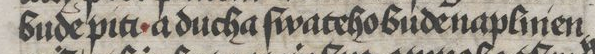bude píti.a ducha ſwateho bude naplnien
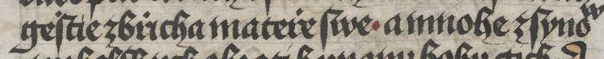geẛtie zbṙicha mateṙe ſwe.a mnohé z ſynow
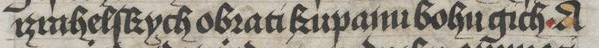izrahelſkych obrati kupanu bohu gich.A
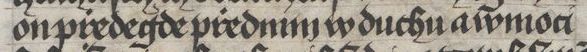on pṙedegde pṙednim wduchu a wmoci
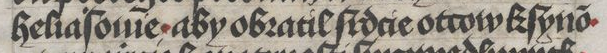heliaẛouie.aby obratil ſrdcie otcow kſynō
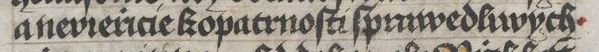a nevieṙicíe kopatrnoſti ſprawedliwych.
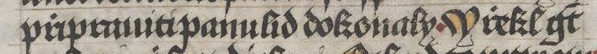pṙipruiti panu lid dokonaly.Y ṙekl ḡt
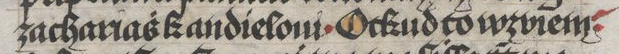zachariaṡ k andieloui.Otkud to wzviem?
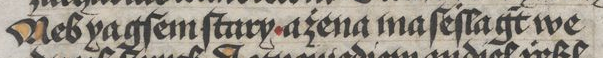Neb ya gſem ſtary.a žena ma ſeẛla ḡt we
